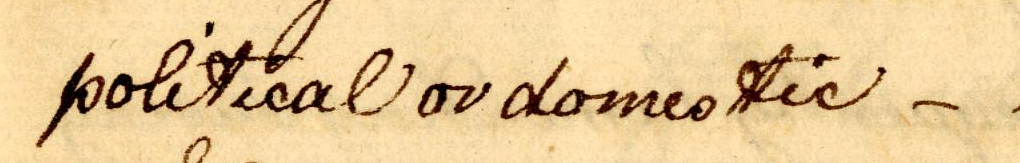political or domestic-
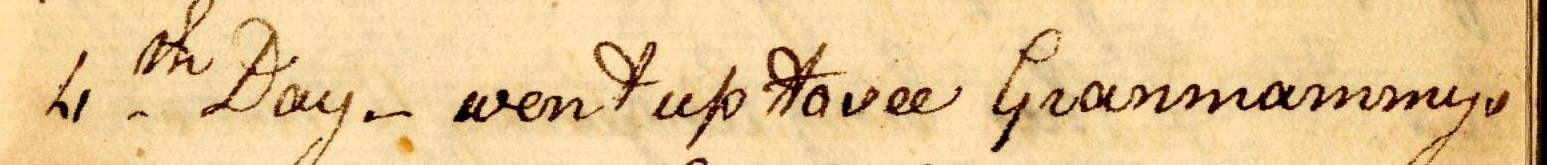4^th Day- went up to see Granmammys
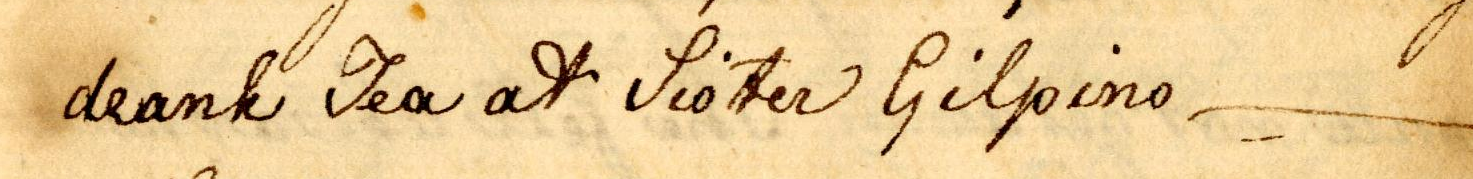drank Tea at Sister Gilpins-
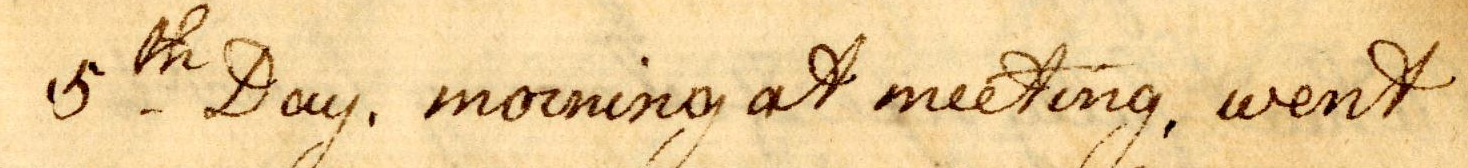5^th Day. morning at meeting, went
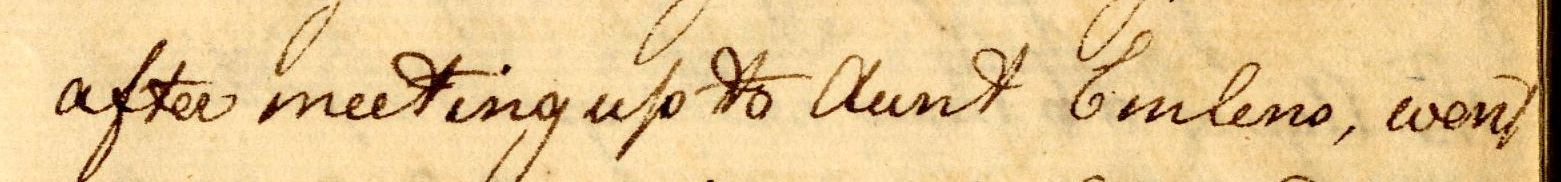after meeting to Aunt Emlens, went
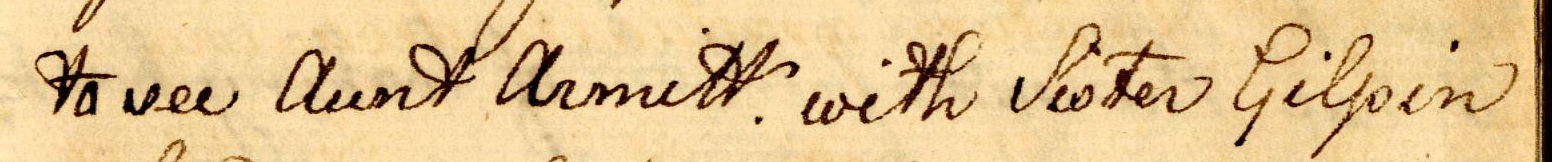to see Aunt Armitt with Sister Gilpin
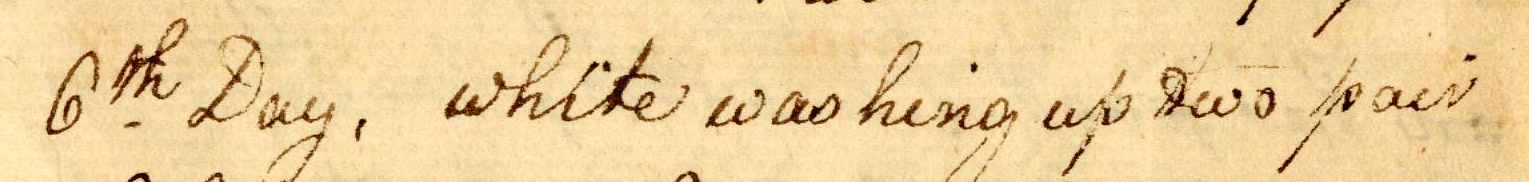6^th Day, white washing up two pair
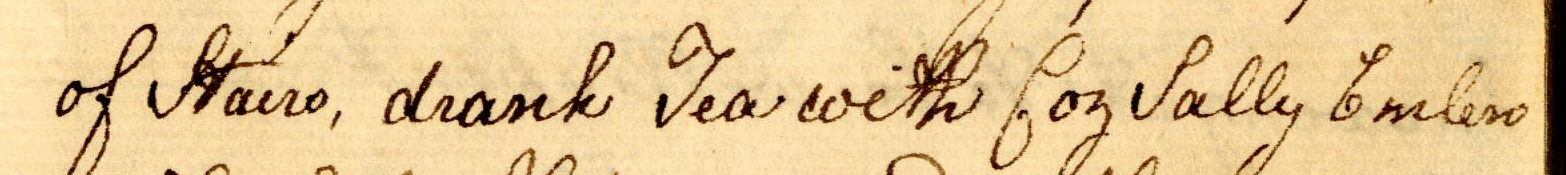of Stairs, drank Tea with Coz Sally Emlen
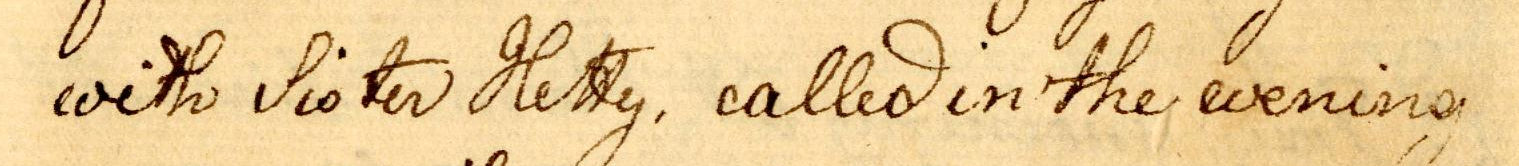with Sister Hetty, called in the evening
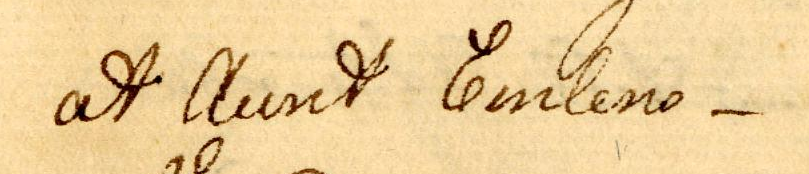at Aunt Emlens-
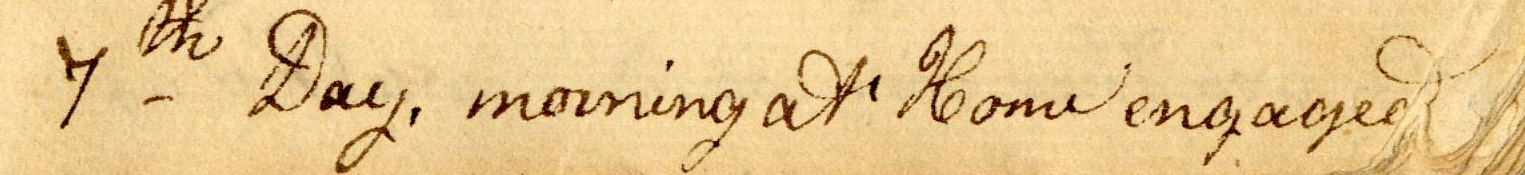7^th Day. morning at Home engaged
